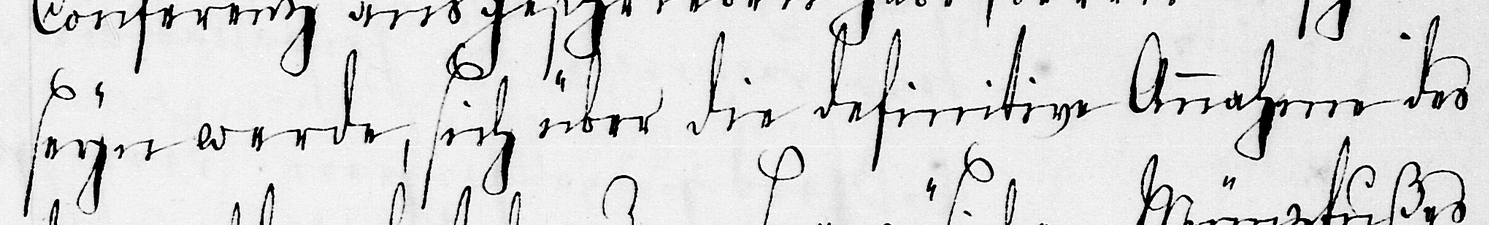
seyn werde, sich über die definitive Annahme des
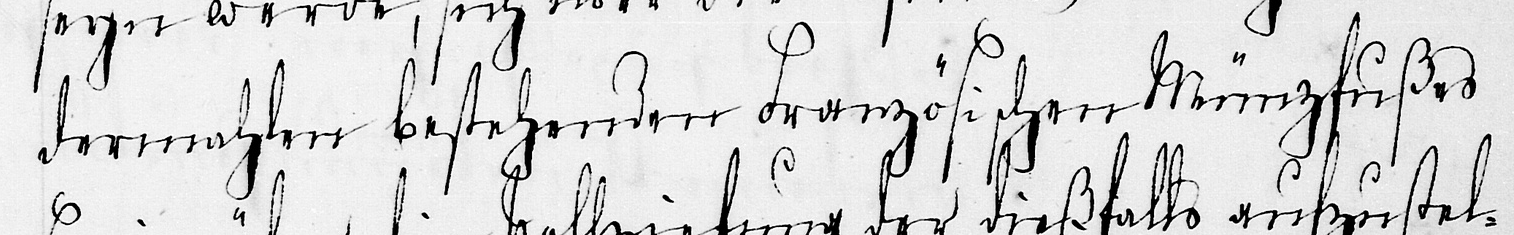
dermahlen bestehenden Französischen Münzfußes
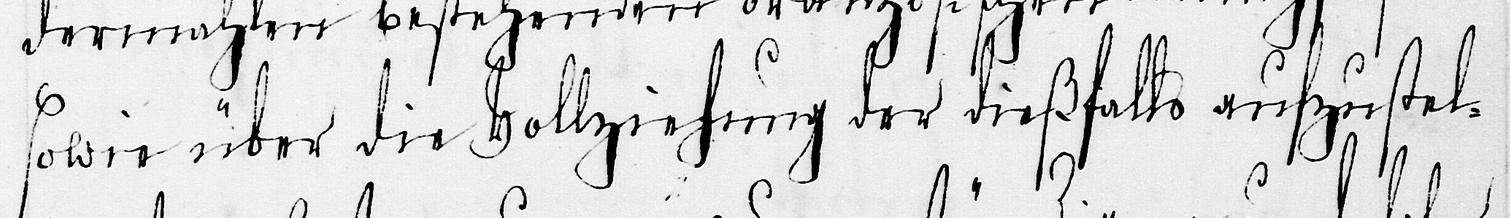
sowie über die Vollziehung der dießfalls aufzustel¬
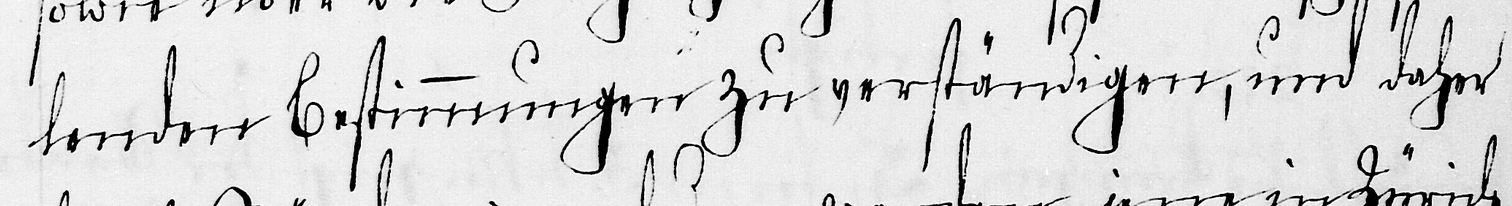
lenden Bestimmungen zu verständigen, und daher
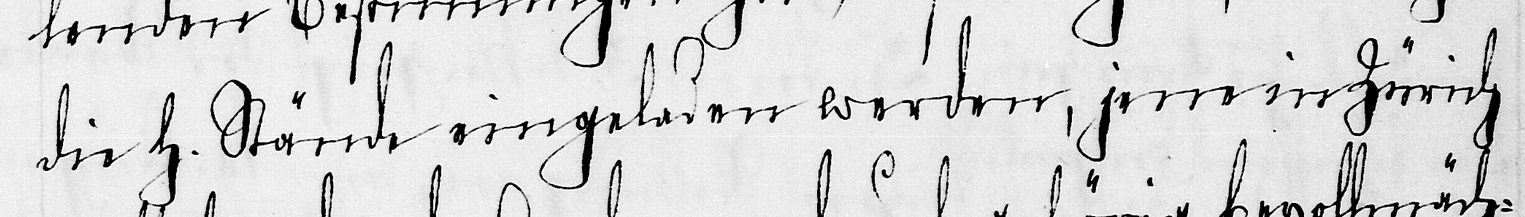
die h. Stände eingeladen werden, jene in Zürich
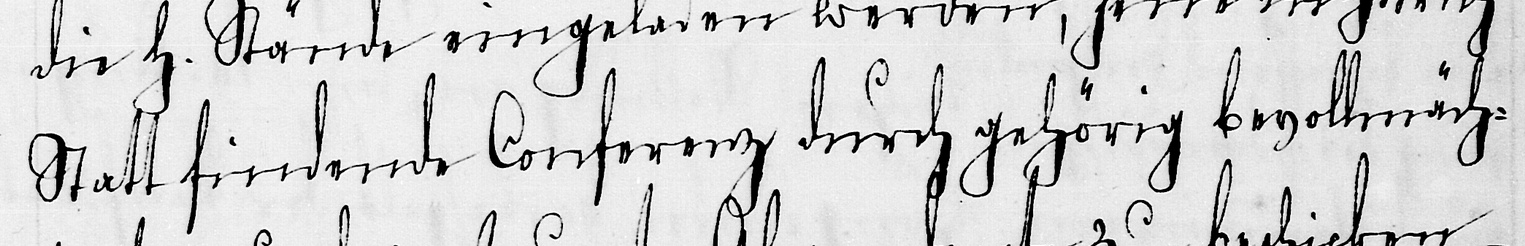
Statt findende Conferenz durch gehörig bevollmäch¬
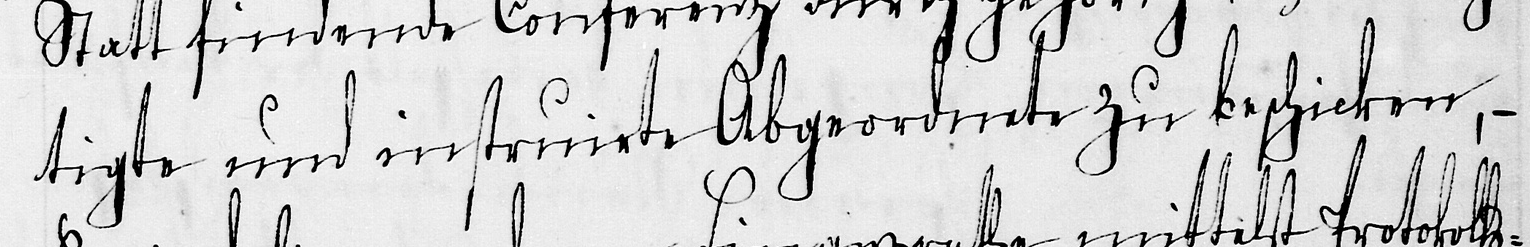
tigte und instruirte Abgeordnete zu beschicken,
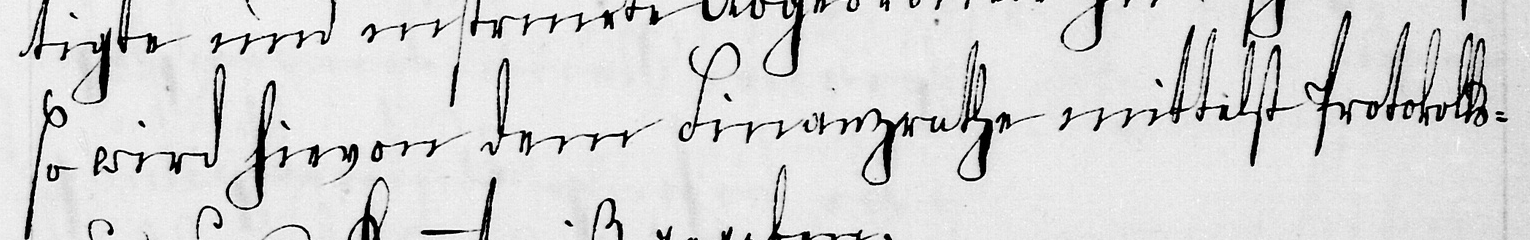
so wird hievon dem Finanzrathe mittelst Protokol¬
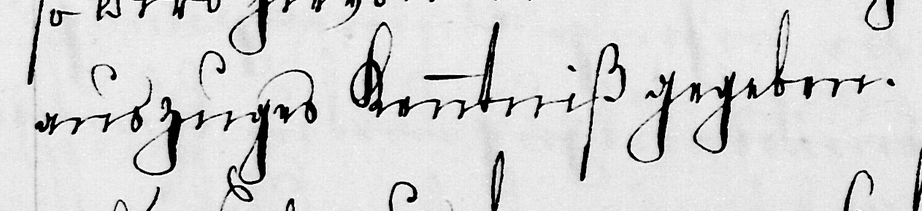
auszuges Kenntniß gegeben.
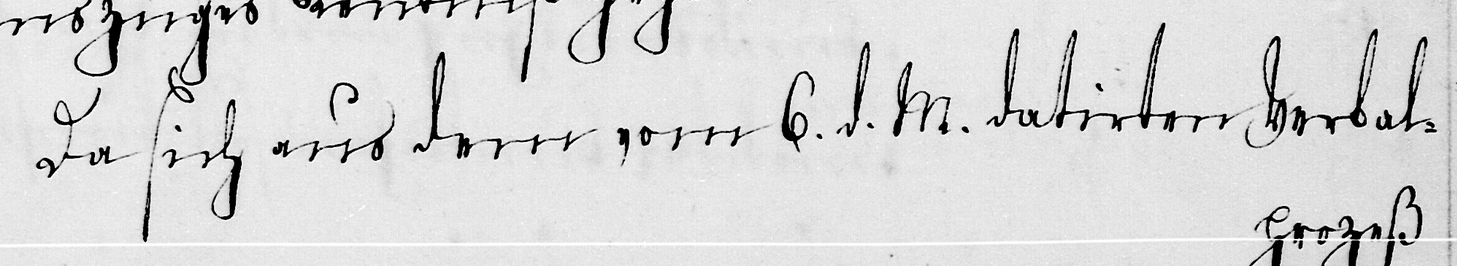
Da sich aus dem vom 6. d. M. datirten Verbal-
